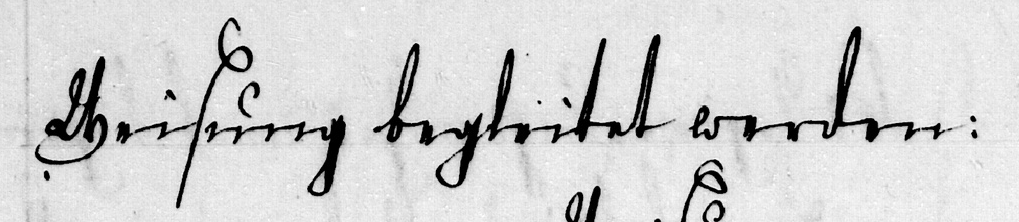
Weisung begleitet werden:
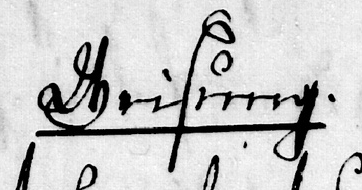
Weisung.
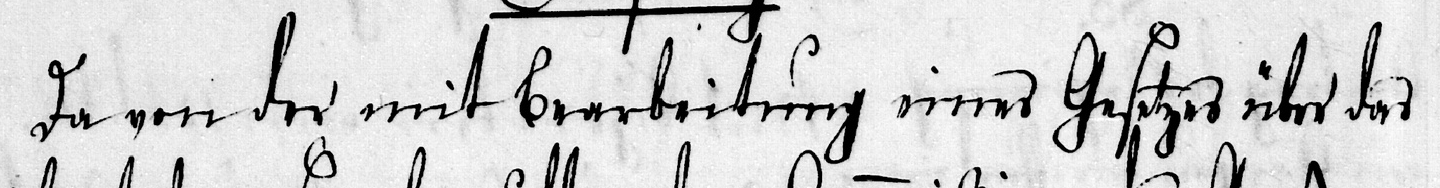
Da von der mit Bearbeitung eines Gesetzes über das
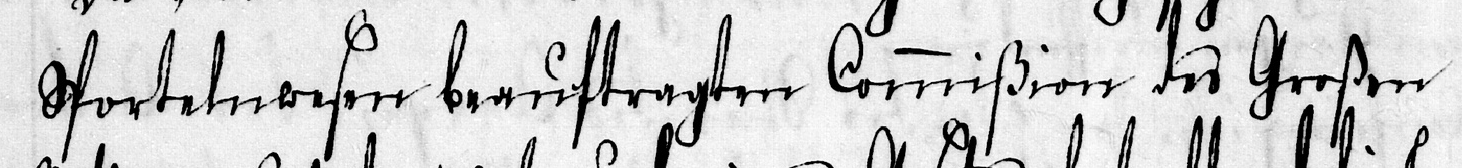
Sportelnwesen beauftragten Commißion des Großen
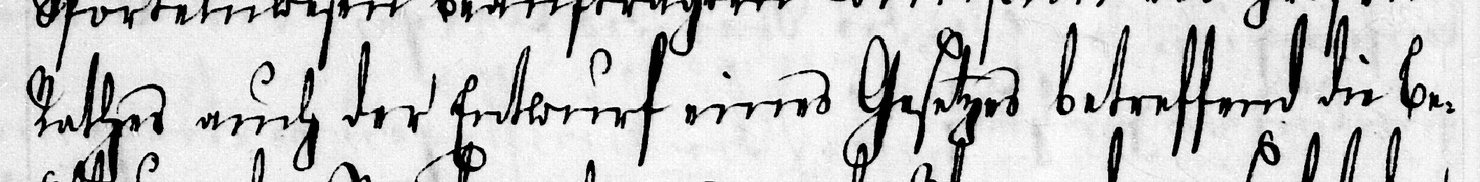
Rathes auch der Entwurf eines Gesetzes betreffend die B¬
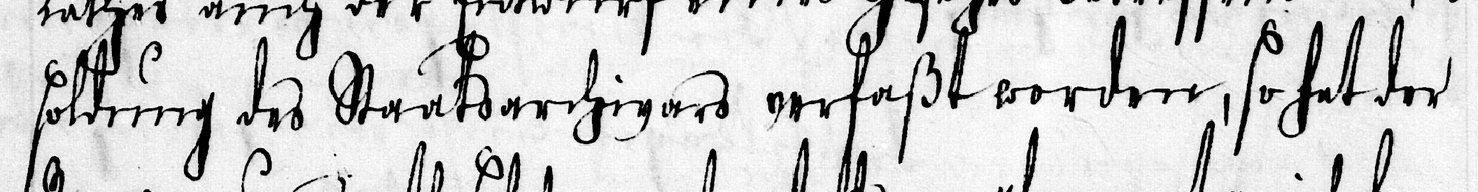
soldung des Staatsarchivars verfaßt worden, so hat der
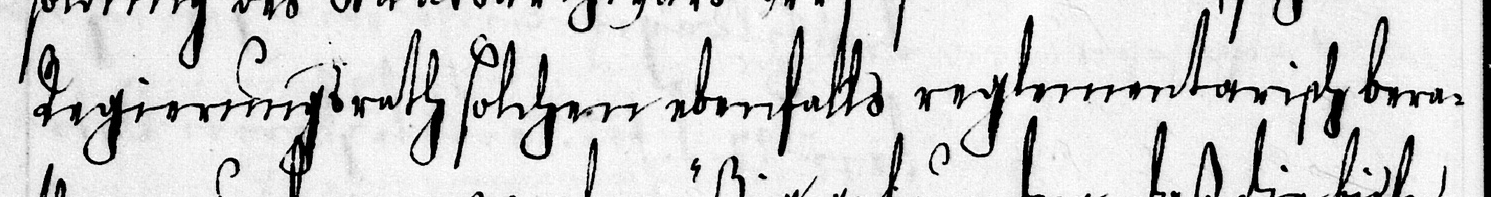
Regierungsrath solchen ebenfalls reglementarisch bera¬
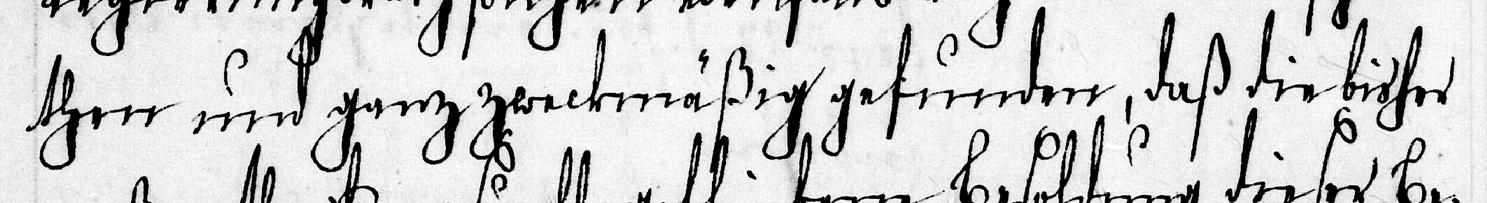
then und ganz zweckmäßig gefunden, daß die bisher
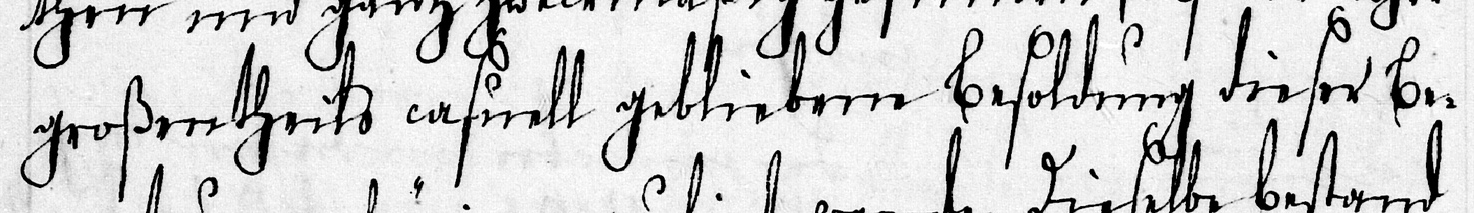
großentheils casuell gebliebene Besoldung dieser Be¬
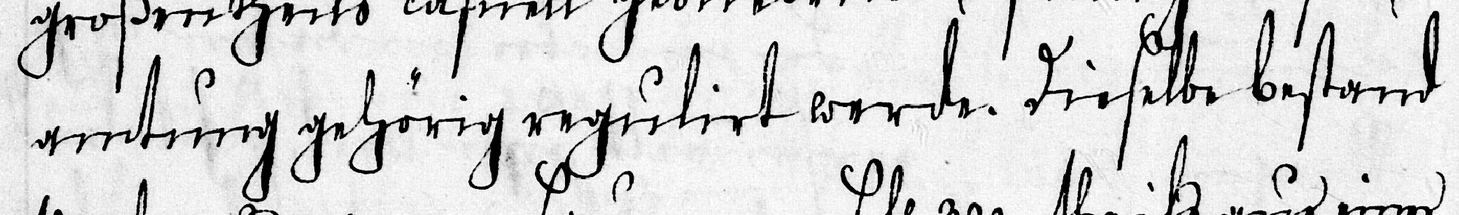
amtung gehörig regulirt werde. Dieselbe bestand
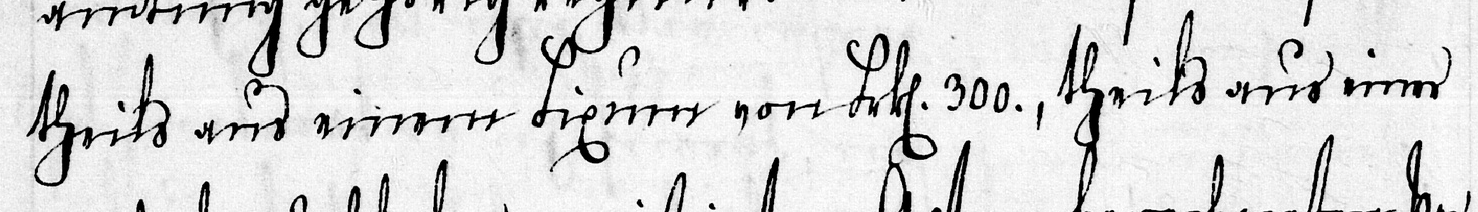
theils aus einem Fixum von Frk[en]. 300., theils aus einer
